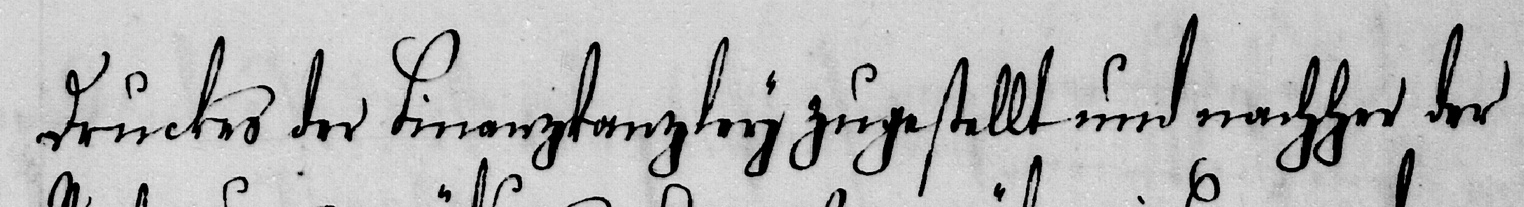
Druckes der Finanzkanzley zugestellt und nachher der
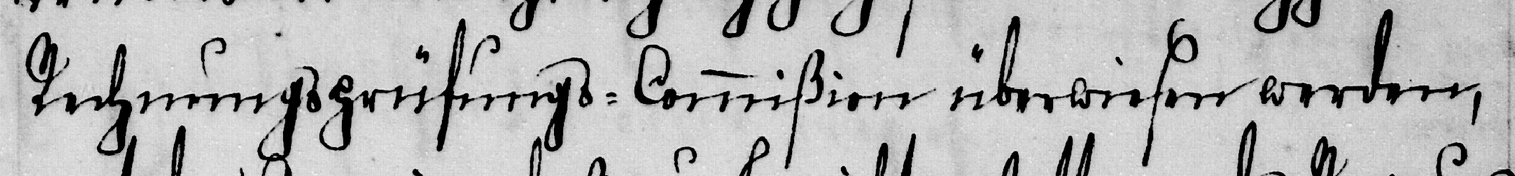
Rechnungsprüfungs-Commißion überwiesen werden,
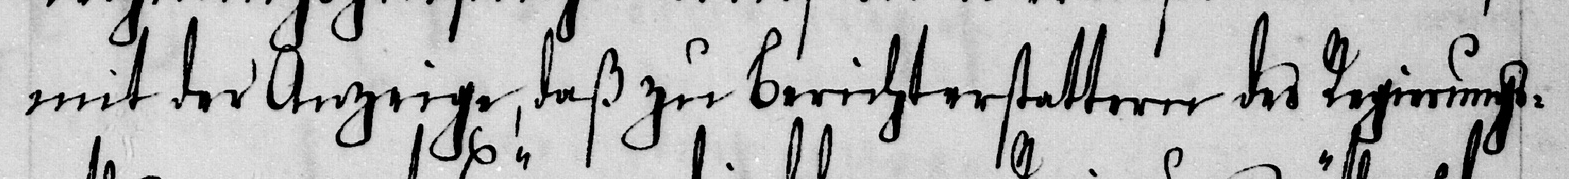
mit der Anzeige, daß zu Berichterstattern des Regierungs¬
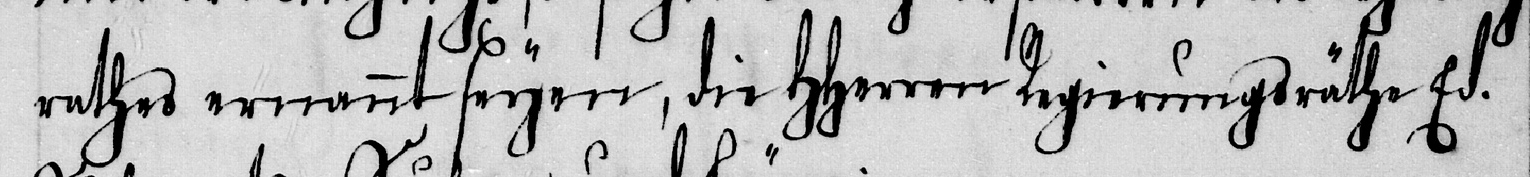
rathes ernannt seyen, die HHerren Regierungsräthe Ed.
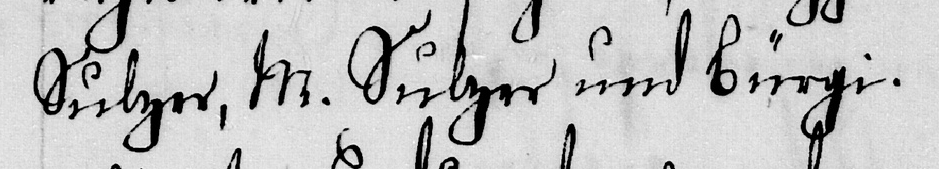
Sulzer, M. Sulzer und Bürgi.
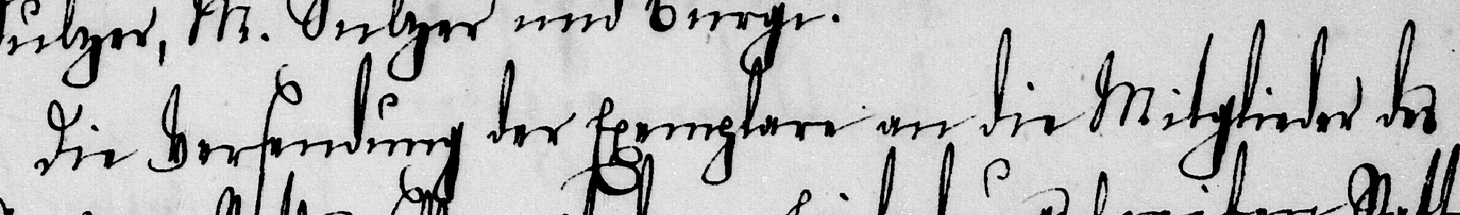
Die Versendung der Exemplare an die Mitglieder des
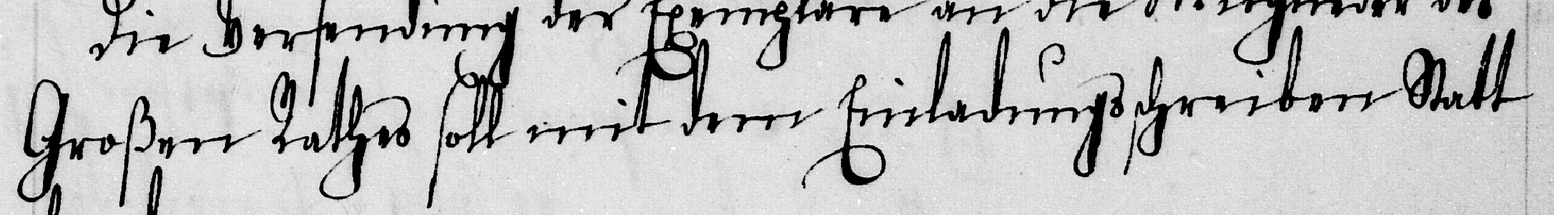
Großen Rathes soll mit dem Einladungsschreiben Statt
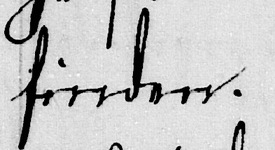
finden.
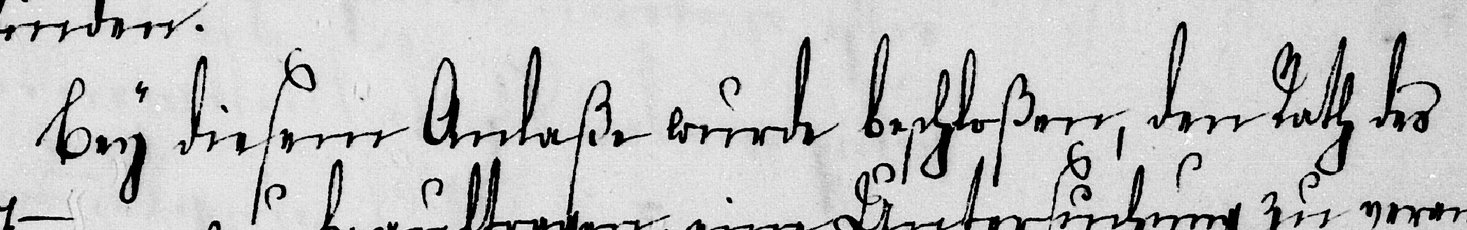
Bey diesem Anlaße wurde beschloßen, den Rath des
